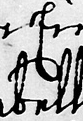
5.
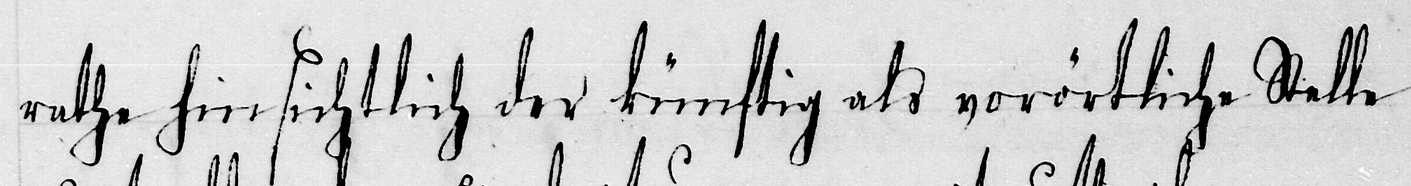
rathe hinsichtlich der künftig als vorörtliche Stelle
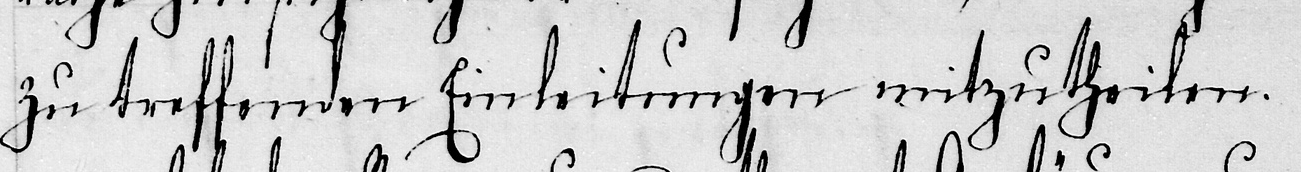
zu treffenden Einleitungen mitzutheilen.
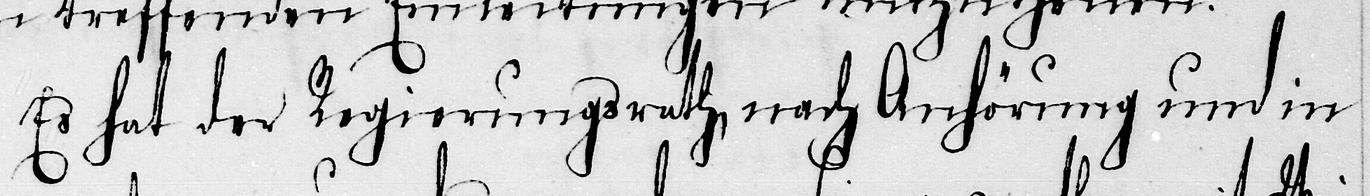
Es hat der Regierungsrath, nach Anhörung und in
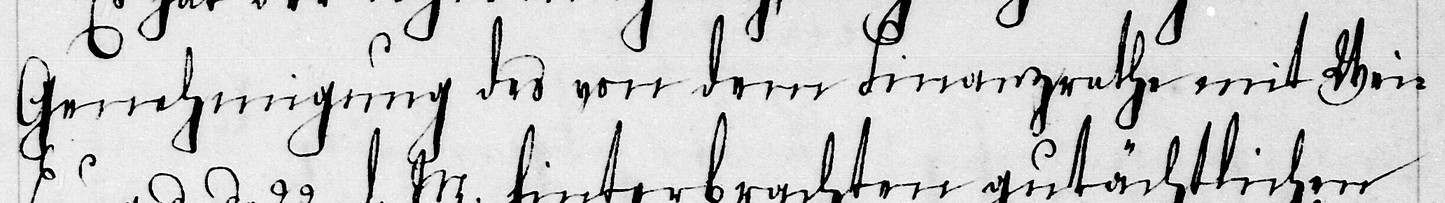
Genehmigung des von dem Finanzrathe mit Wei¬
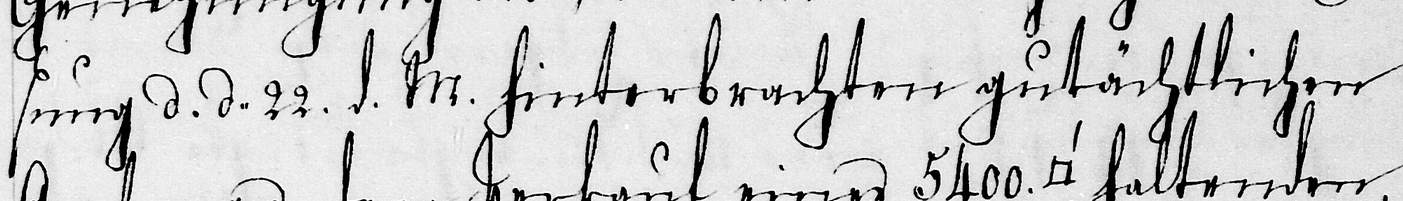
sung d. d. 22. d. M. hinterbrachten gutächtlichen
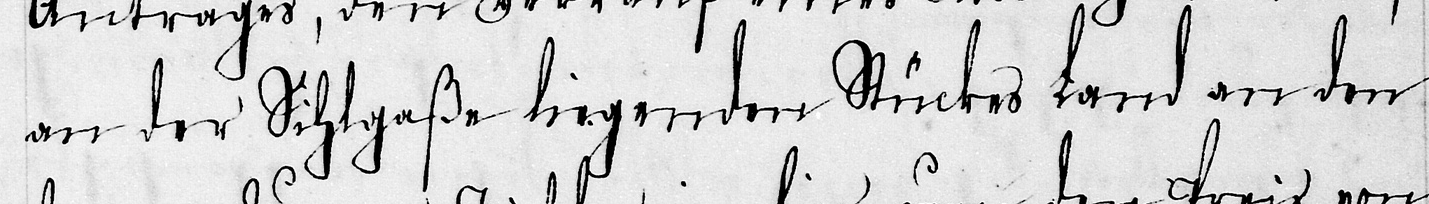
an der Sihlgaße liegenden Stückes Land an den
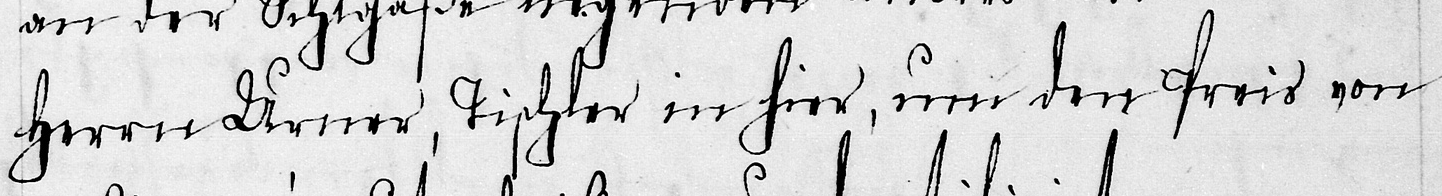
Herrn Urner, Tischler in hier, um den Preis von
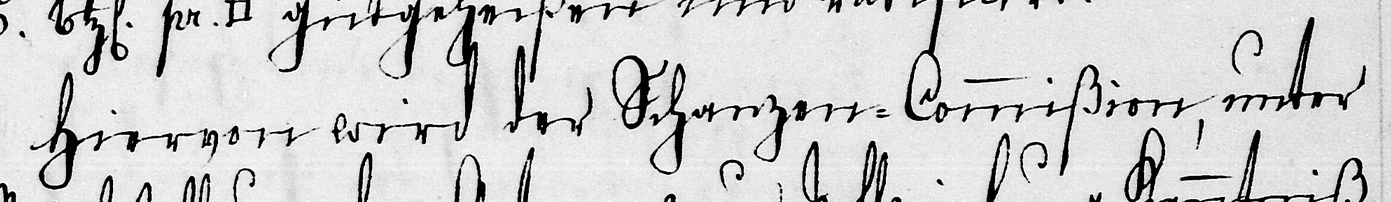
Hiervon wird der Schanzen-Commißion, unter
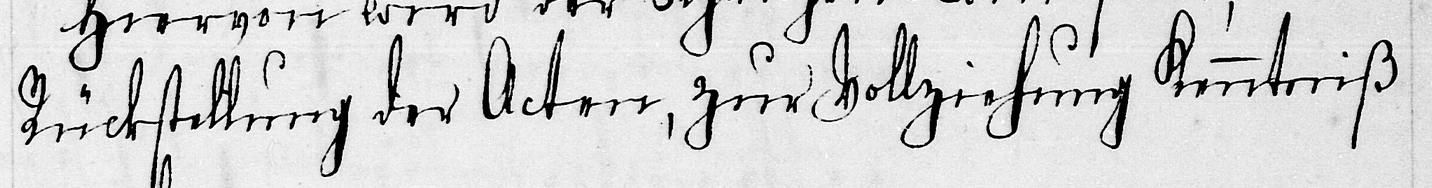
Rückstellung der Acten, zur Vollziehung Kenntniß
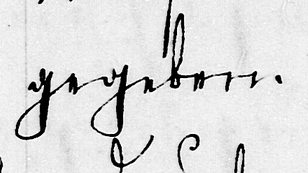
gegeben.
